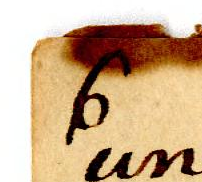6
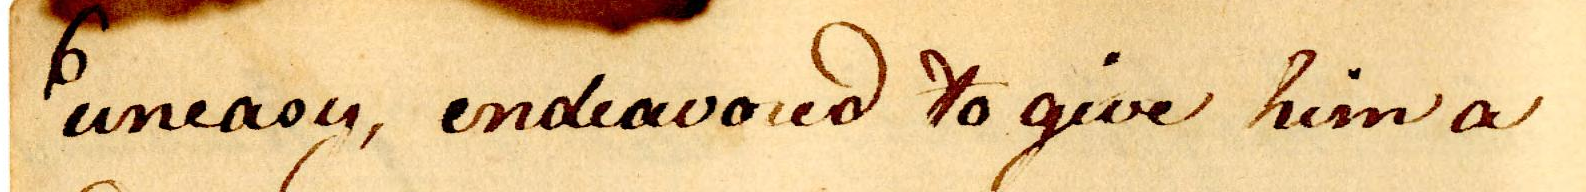uneasy, endeavoured to give him a
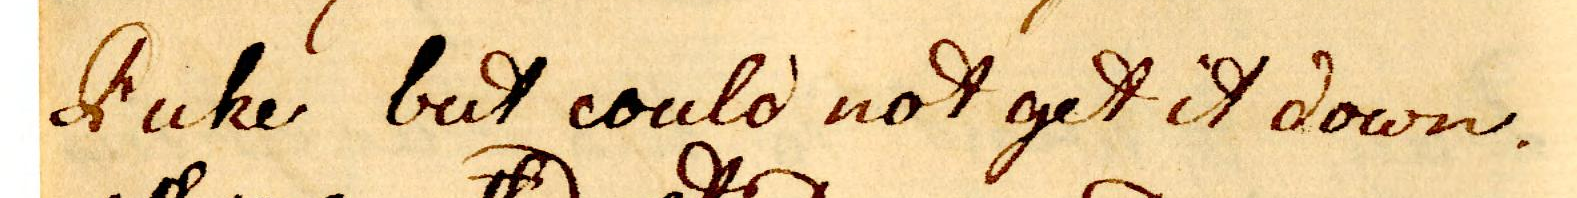Puke but could not get it down.
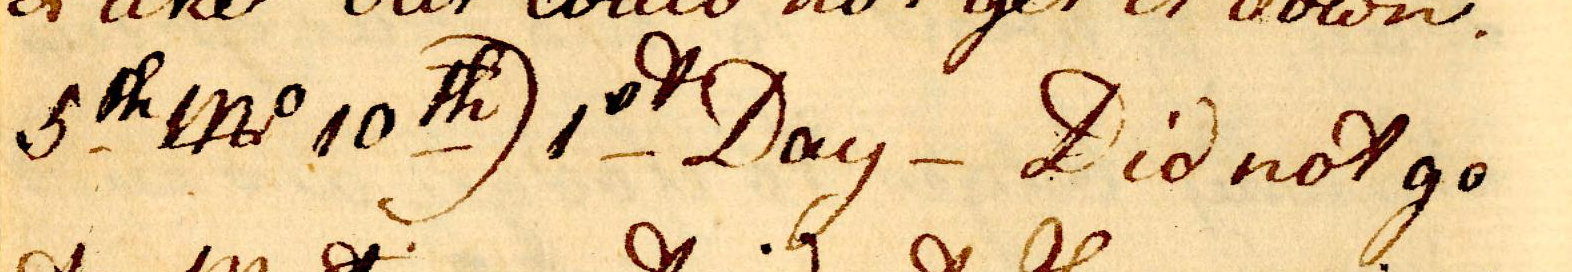5^th M^o 10^th) 1^st Day- Did not go
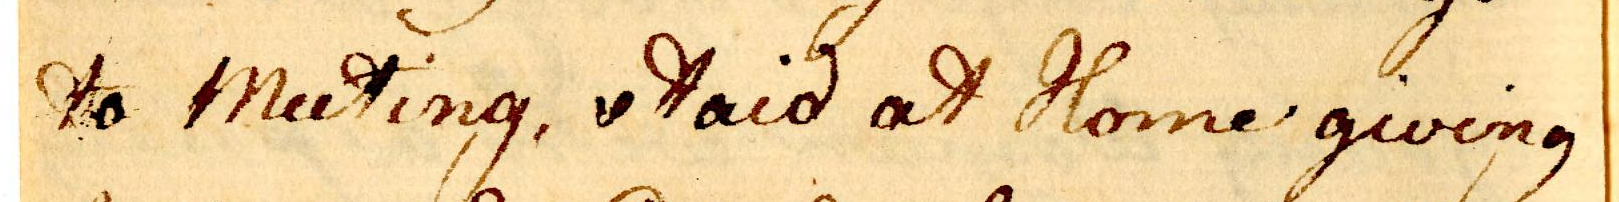to Meeting, staid at Home giving
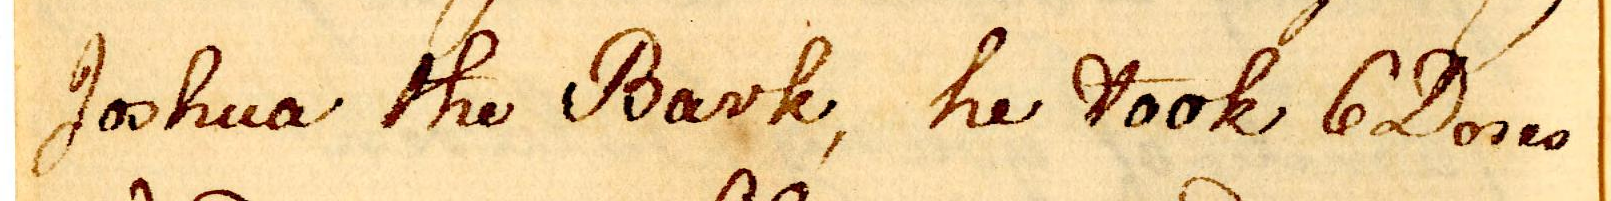Joshua the Bark, he took 6 Doses
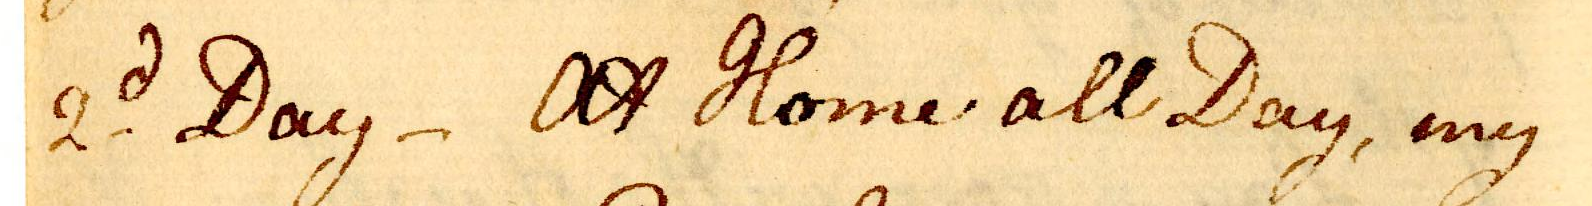2^d Day- At Home all Day, my
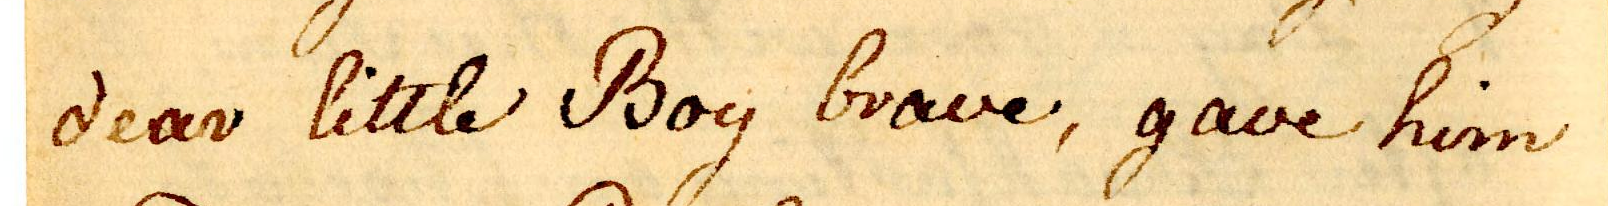dear little Boy brave, gave him
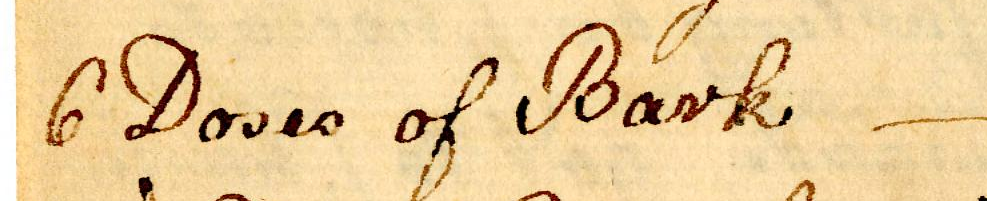6 Doses of Bark
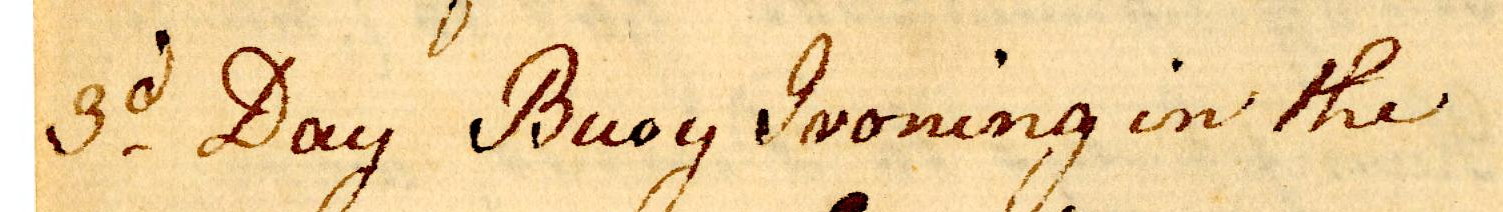3^d. Day Busy Ironing in the
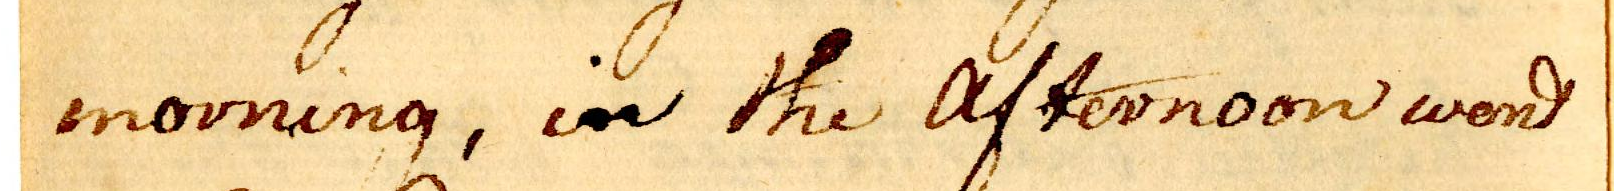morning, in the Afternoon went
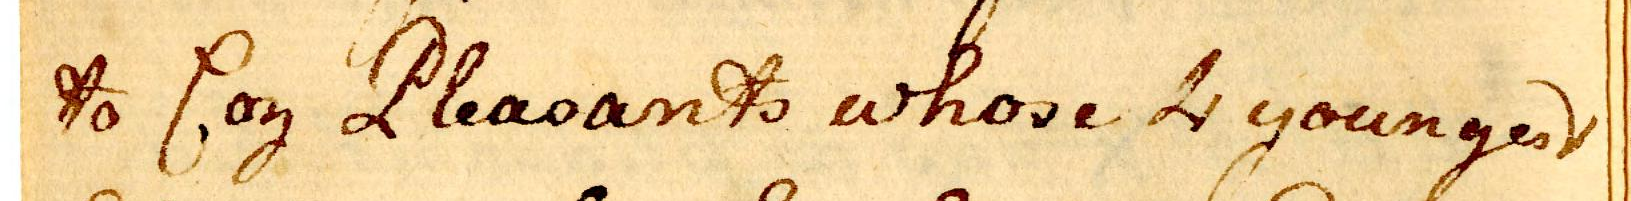to Coz Pleasants whose 4 youngest
